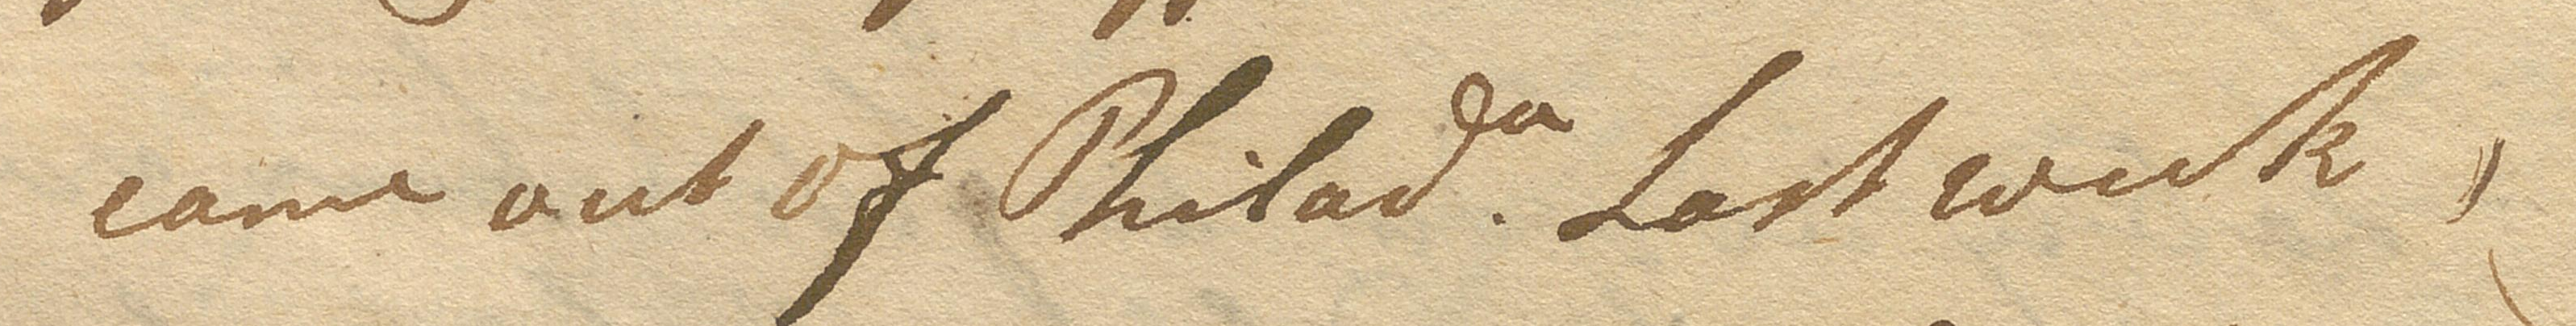came out of Philad^a. Last week,
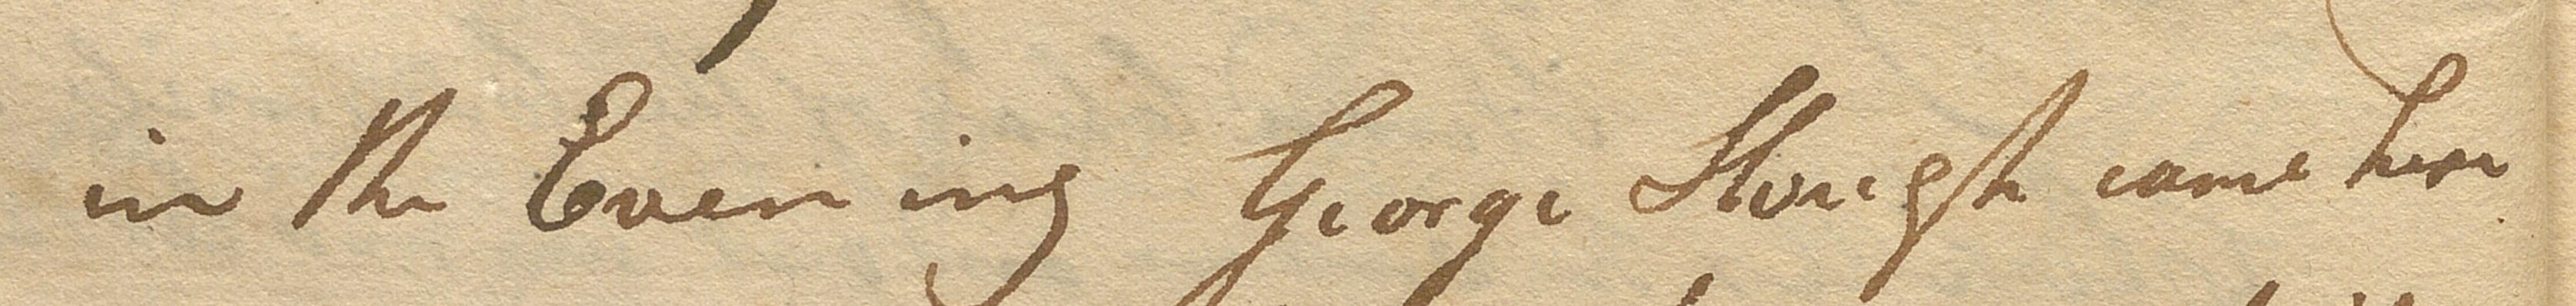in the Evening George Slough came here
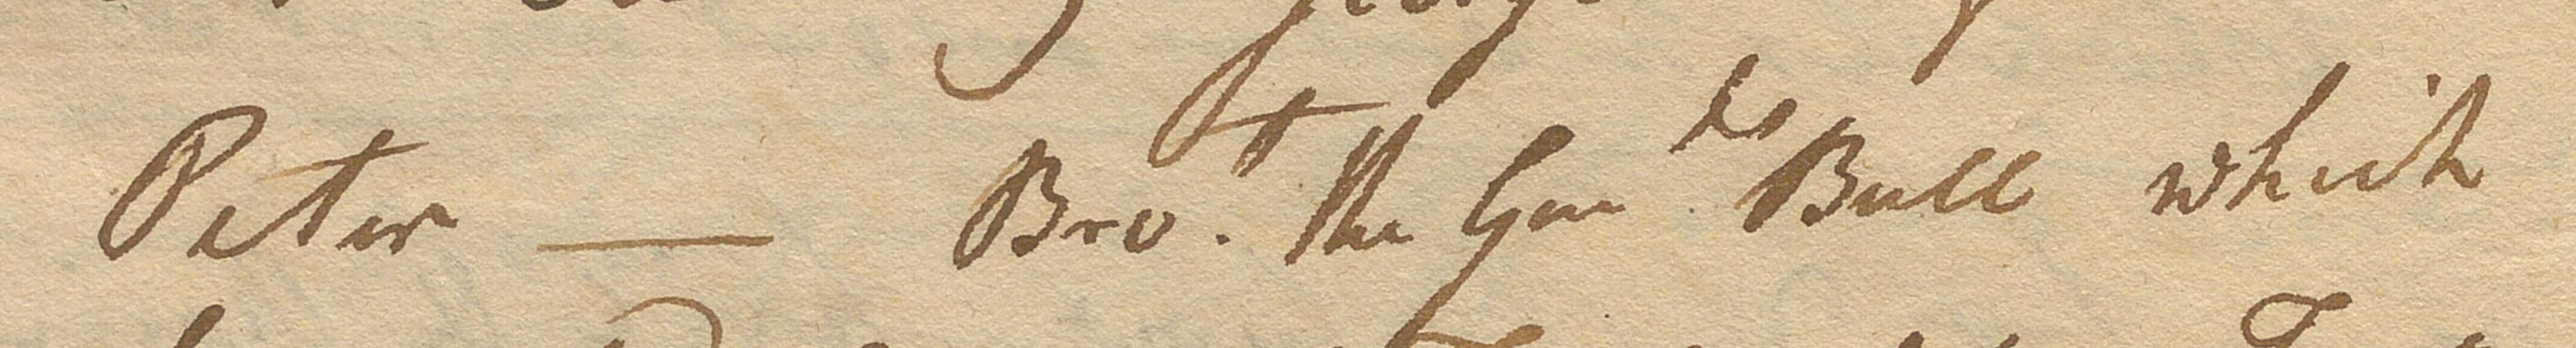Peter- Bro^t. the Gen^l. Bull which
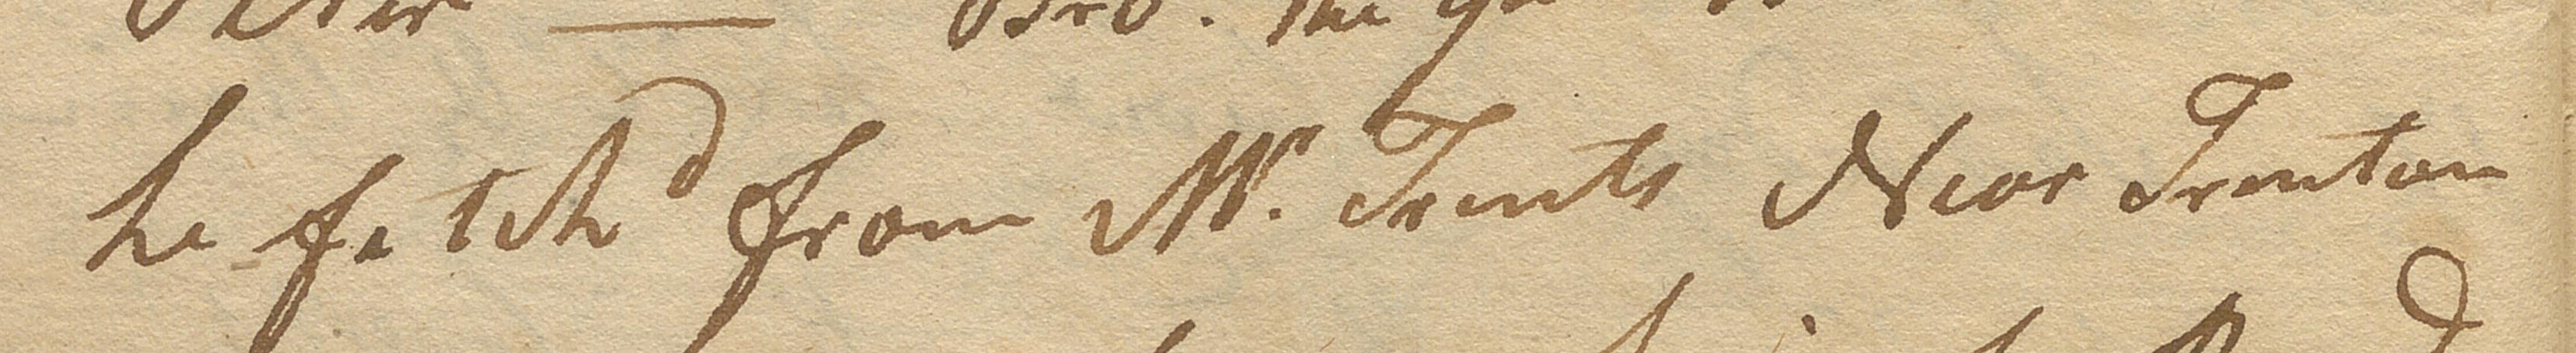he fetch^d. from M^r. Trents Neor Trenton
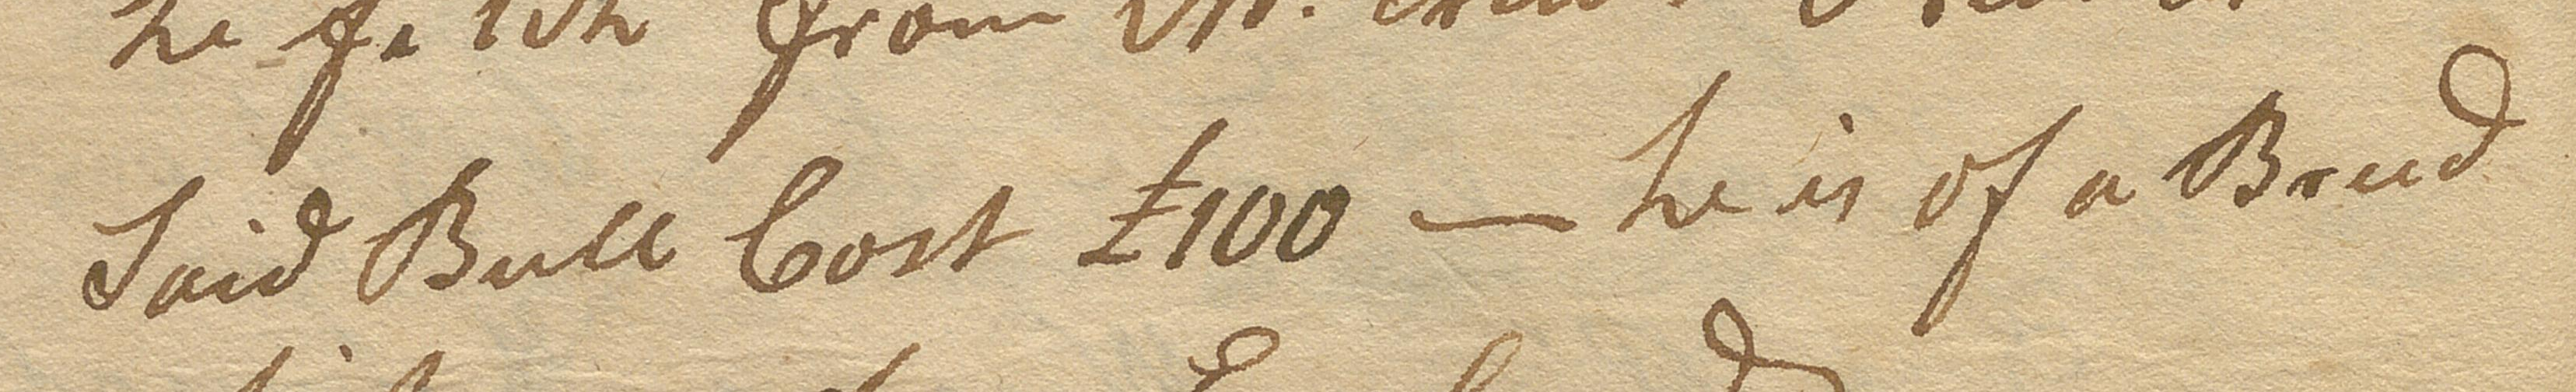Said Bull Cost £100- he is of a Breed
